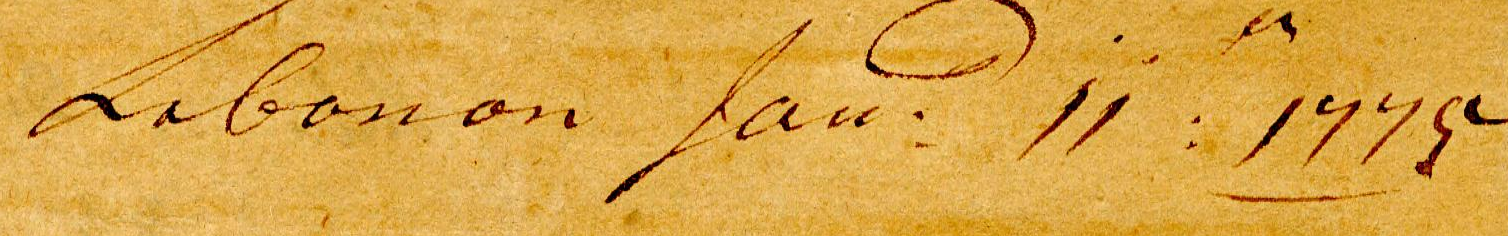Lebanon Jan^y 11^th. 1776
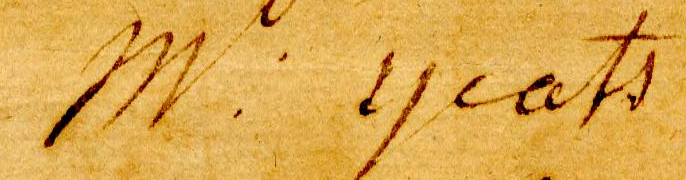M^r. Yeats
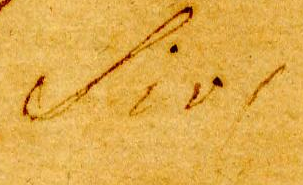Sir
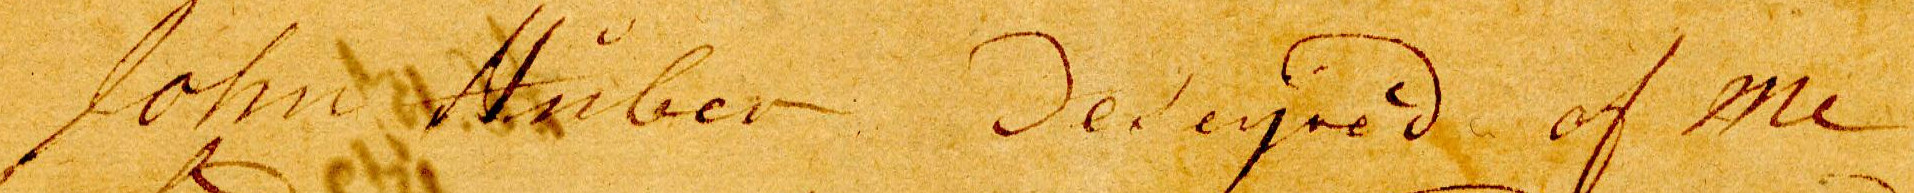John Huber design'd of me
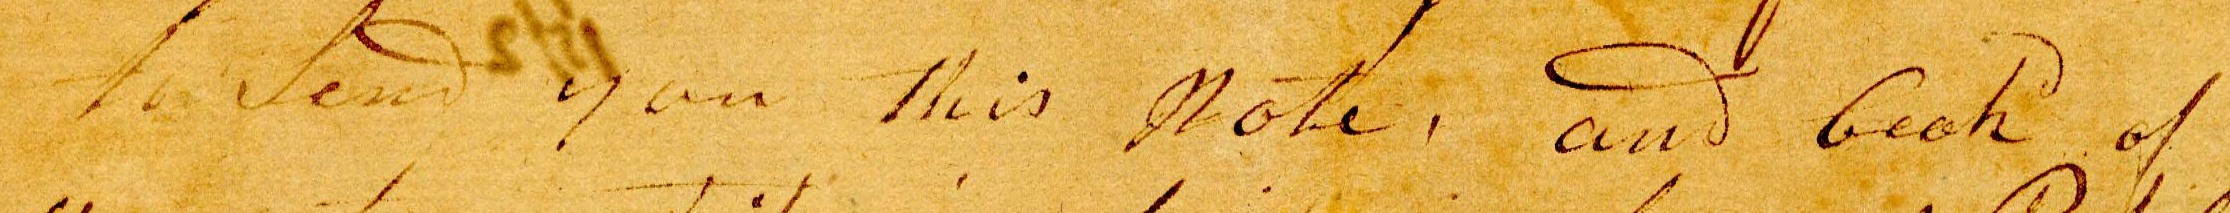To send you this Note, and book of
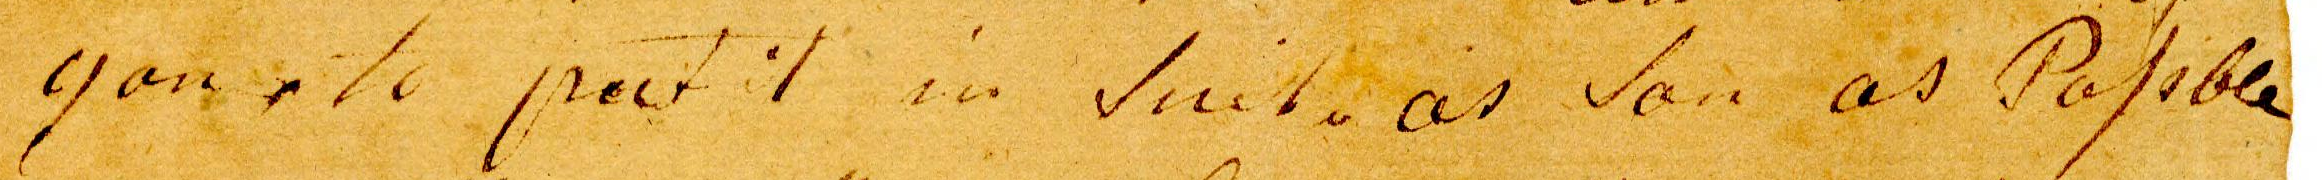you to put it in Suit as Soon as Possible
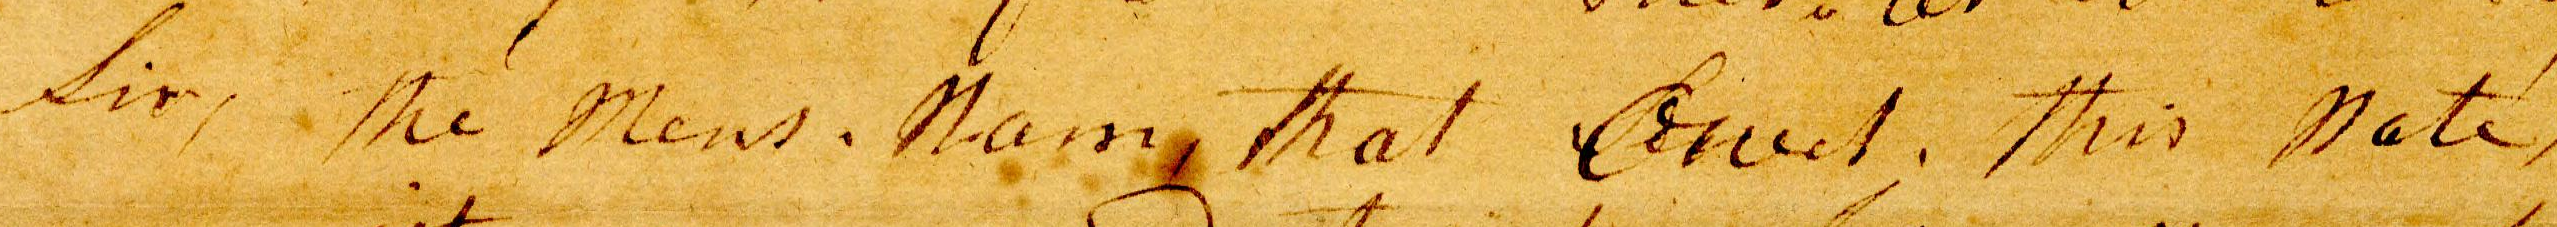Sir, the Mens Nam, that Ouet, this Nate
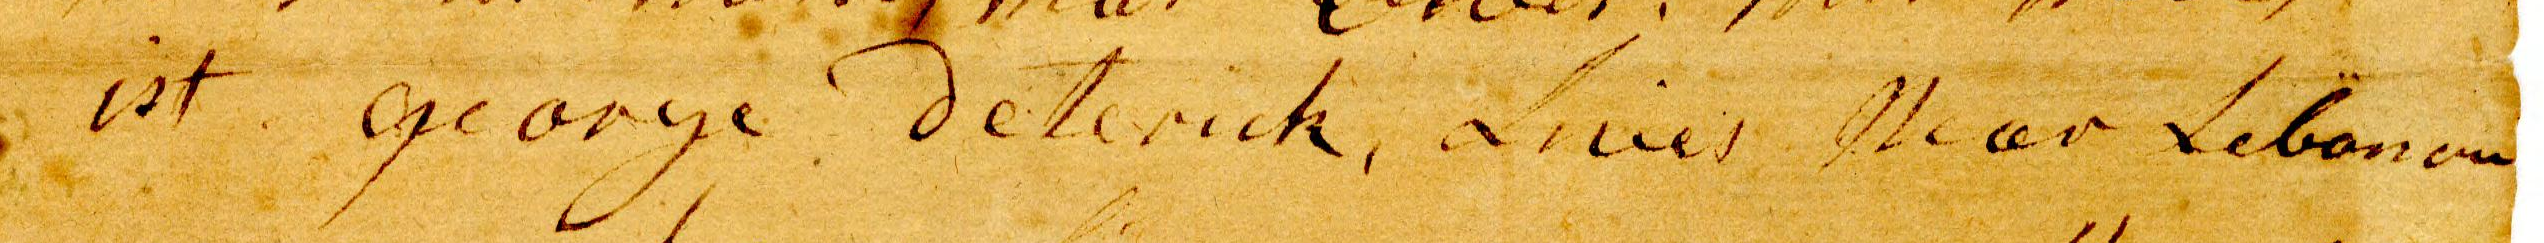ist George deterick lives near Lebanon
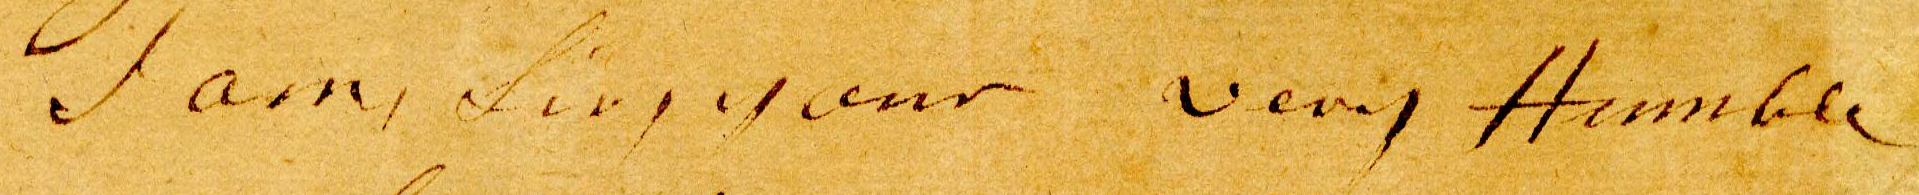I am Sir, your very Humble
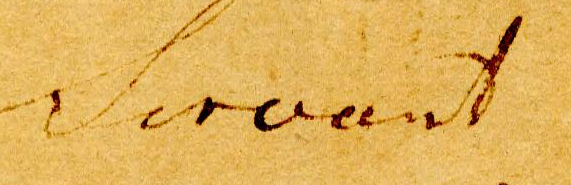Servant
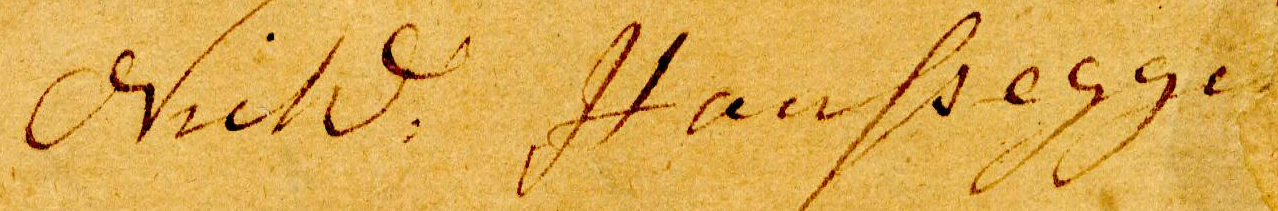Nich^s. Haussegge
